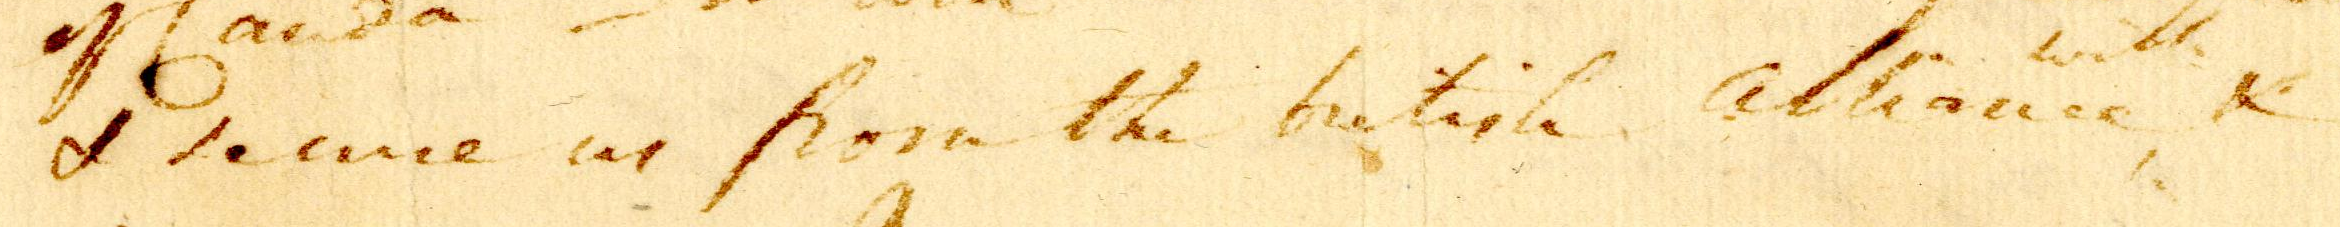& secure us from the British Alliance ^ &
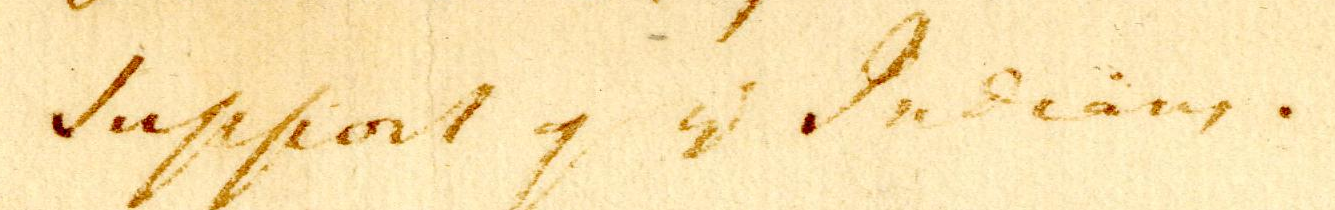Support of y^e Indians.
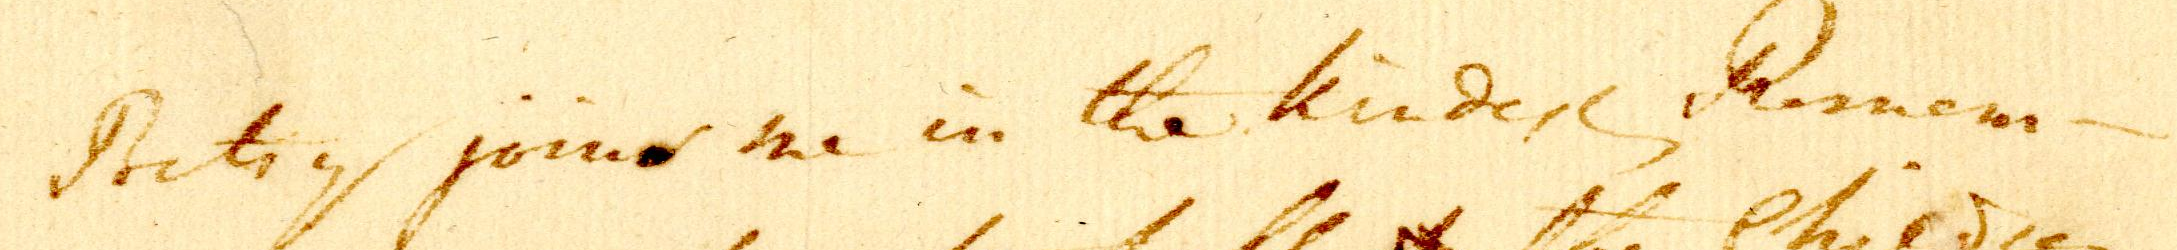Besty joins tme in the kindest Remem-
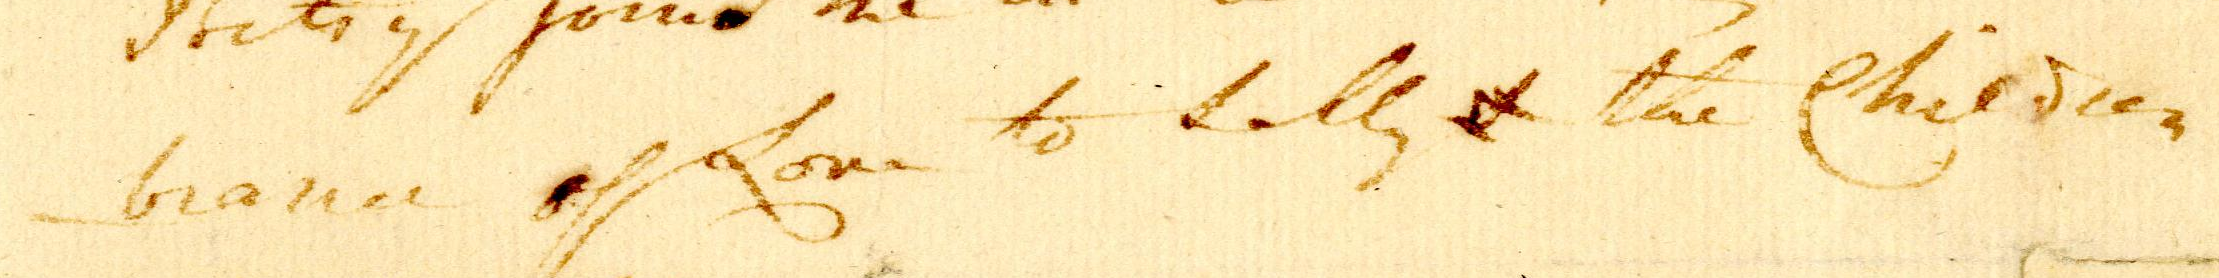-brance of Love to Sally, & the Children
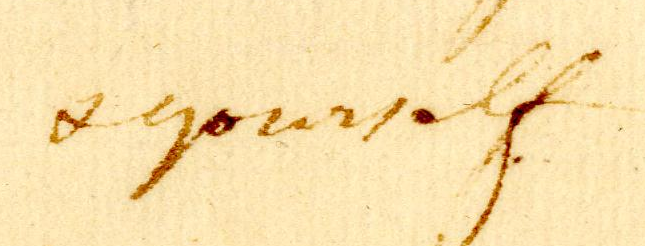& yourself
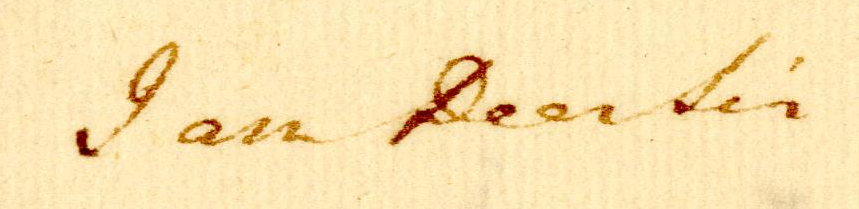I am Dear Sir
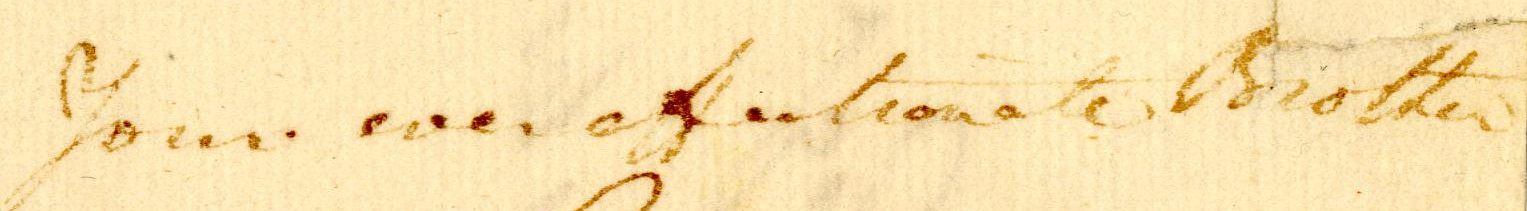Your ever affectionate Brother
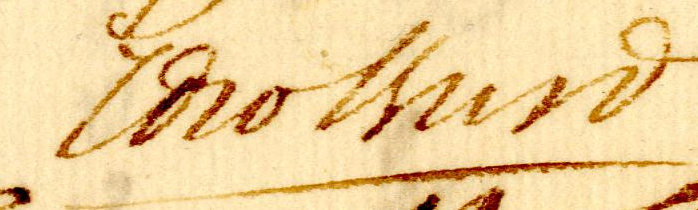Edw. Burd
